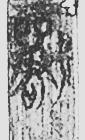戰
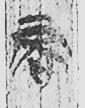丙
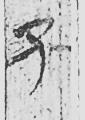子
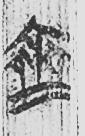齊
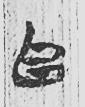𠂤
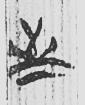至
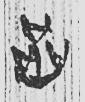喦
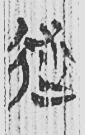述
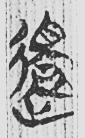還
